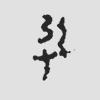兵
